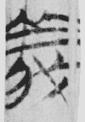義
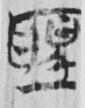聖
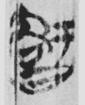智
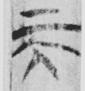天
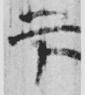下
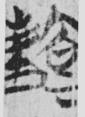法
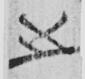之
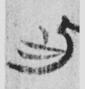此
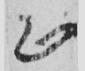㠯
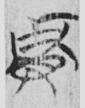貴
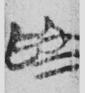爲
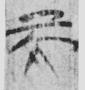天
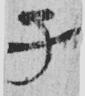子
